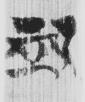卹
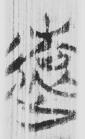遠
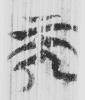而
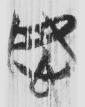悔
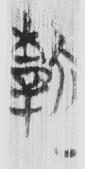新
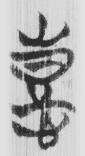𢝫
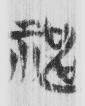神
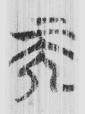而
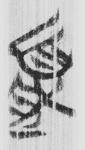{肉頁}
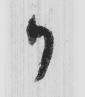人
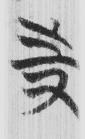寺
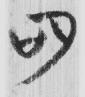名
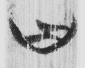曰
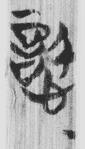{言千心}
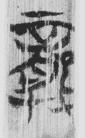龏
